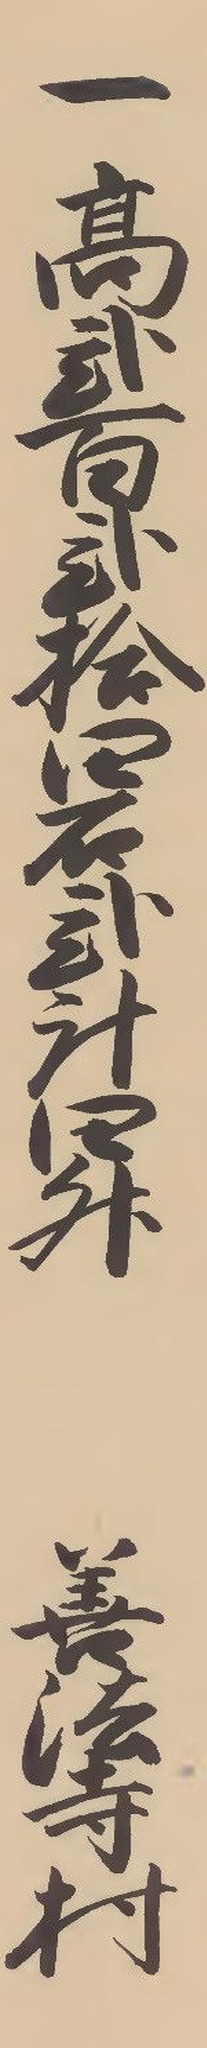一高弐百弐拾四石弐斗四升善法寺村
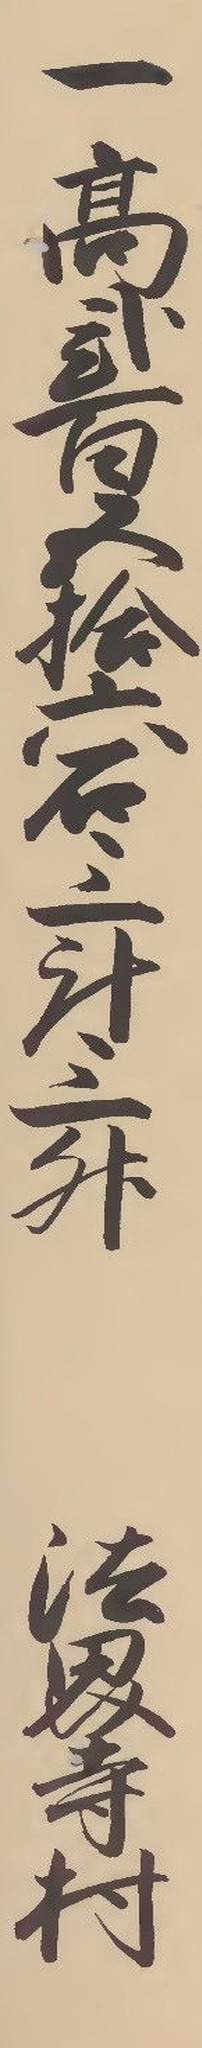一高弐百五拾六石三斗三升法界寺村
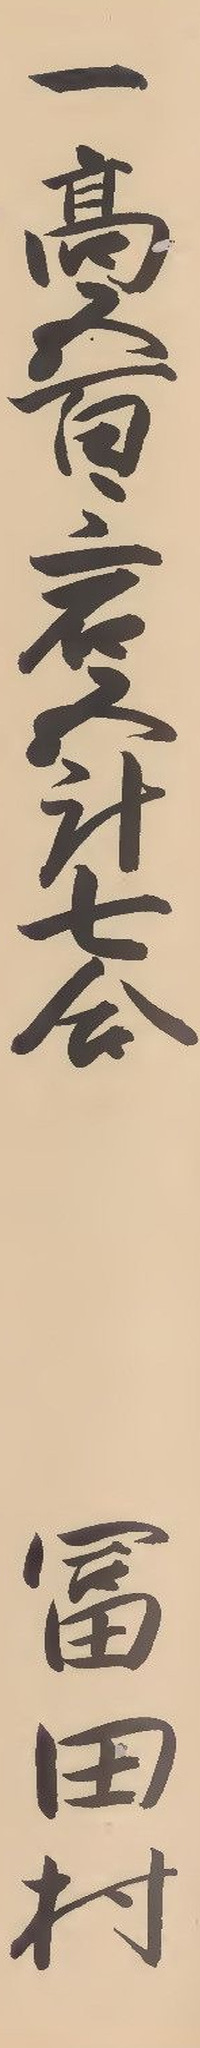一高五百三石五斗七合富田村
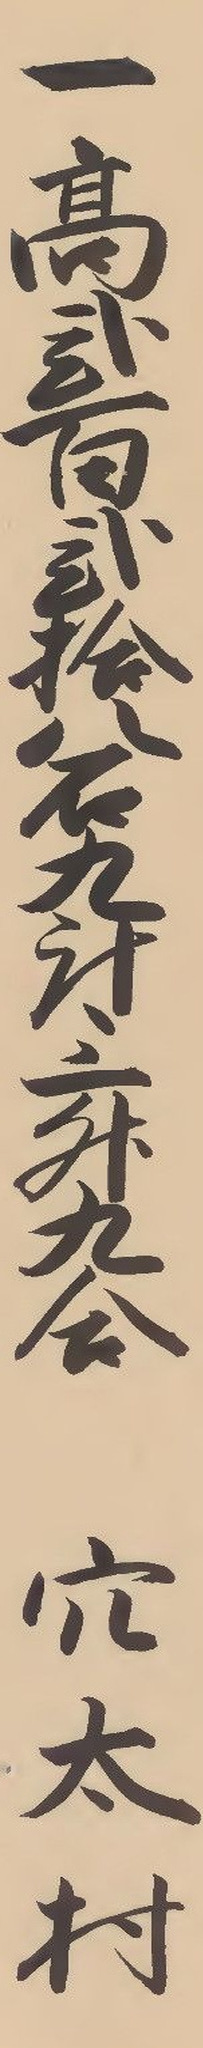一高弐百弐拾八石九斗三升九合穴太村
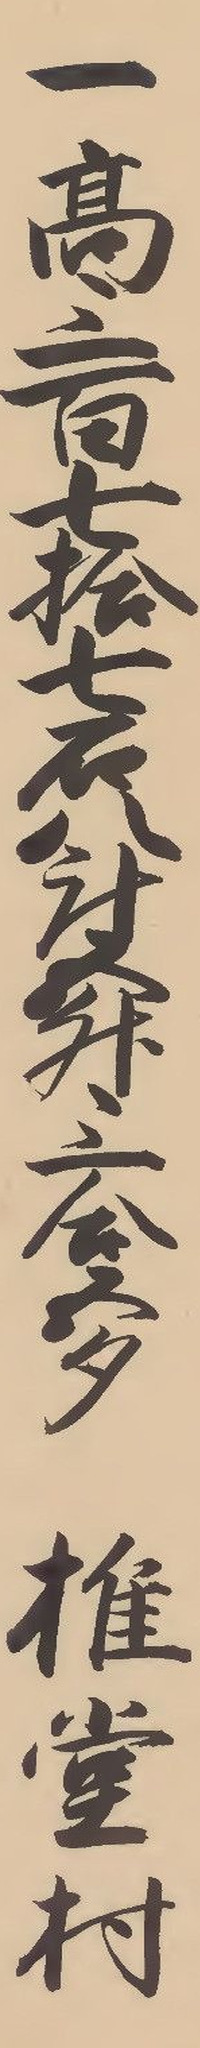一高三百七拾七石八斗五升三合五勺椎堂村
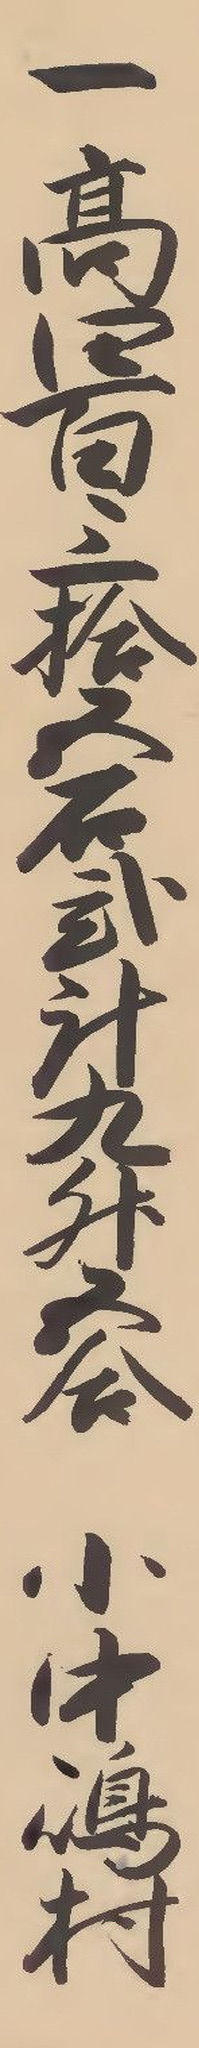一高四百三拾五石弐斗九升五合小中島村

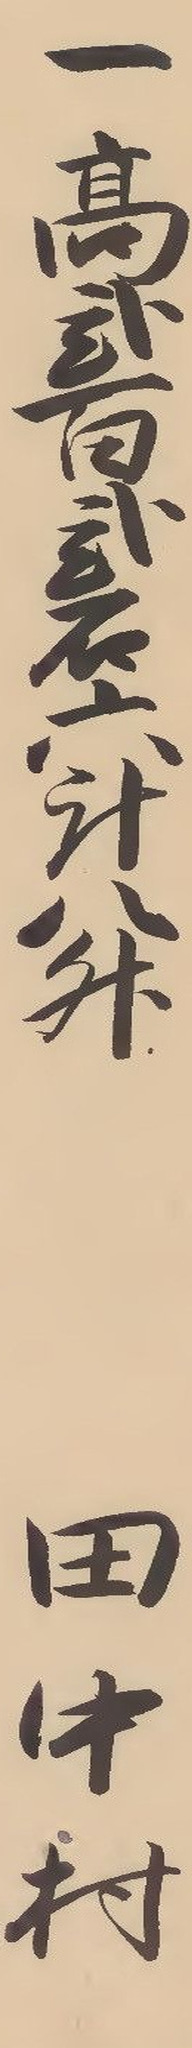一高弐百弐石六斗八升田中村
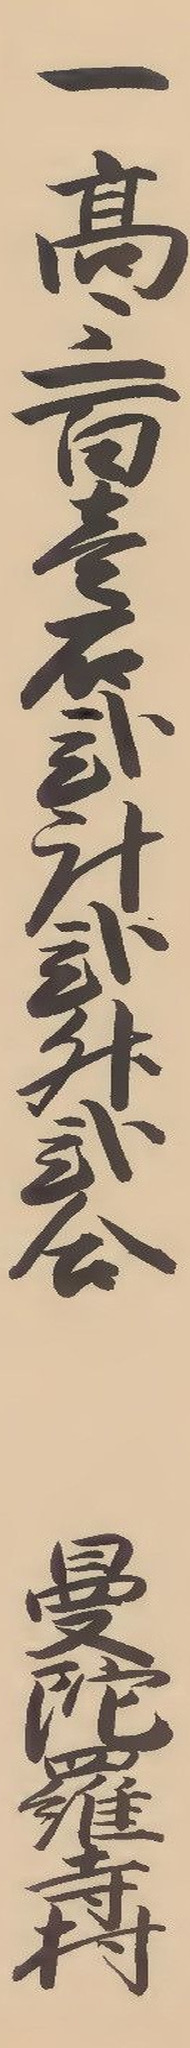一高三百壱石弐斗弐升弐合曼陀羅寺村
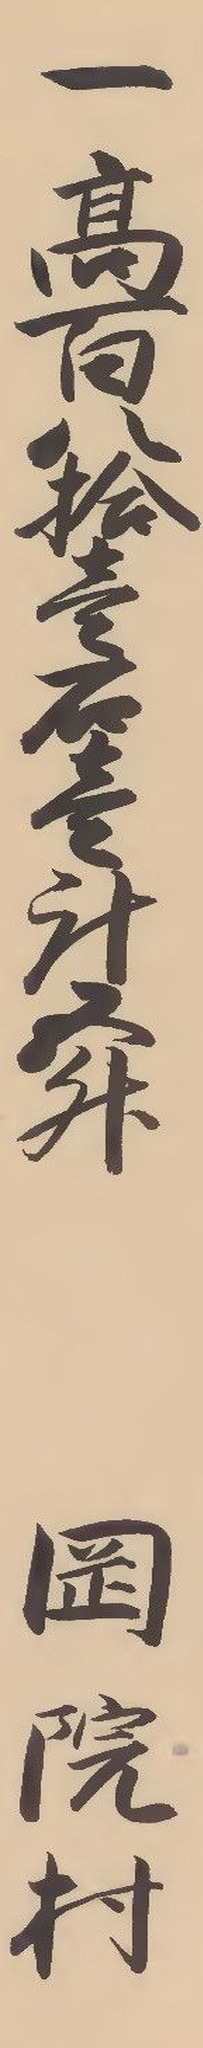一高百八拾壱石壱斗五升岡院村
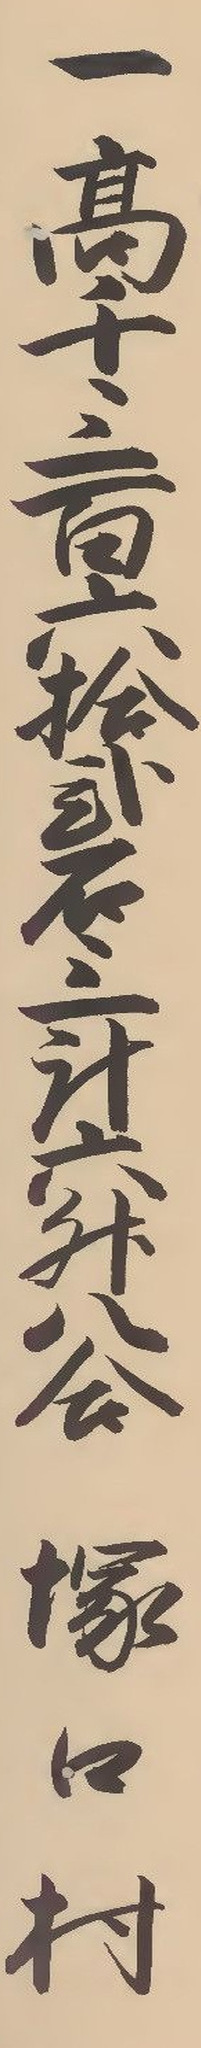一高千三百六拾弐石三斗六升八合塚口村
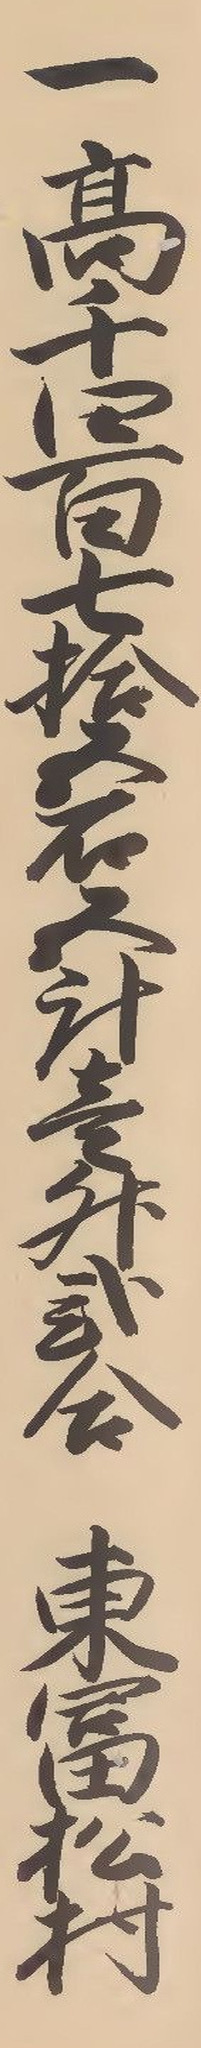一高千四百七拾五石五斗壱升弐合東富松村
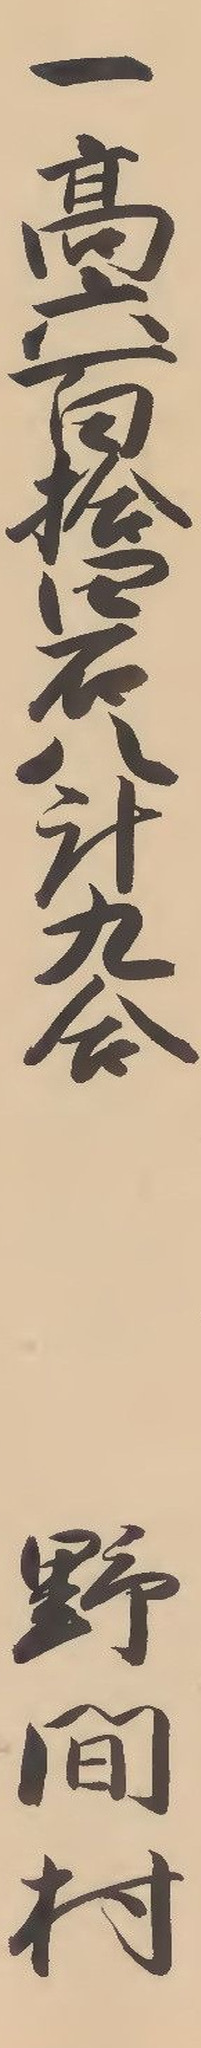一高六百拾四石八斗九合野間村
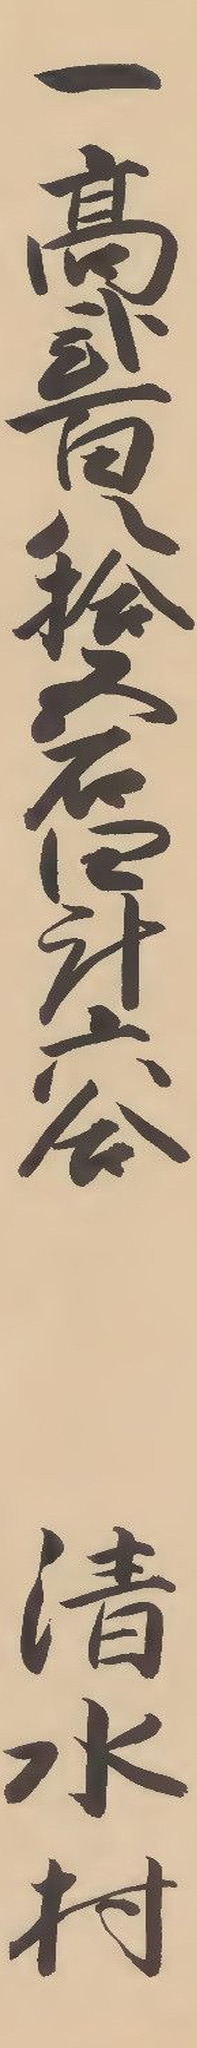一高弐百八拾五石四斗六合清水村
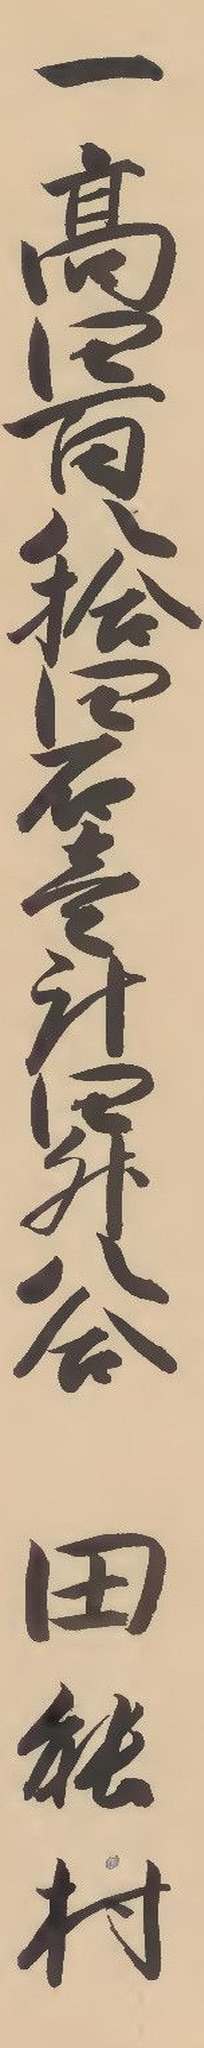一高四百八拾四石壱斗四升八合田能村

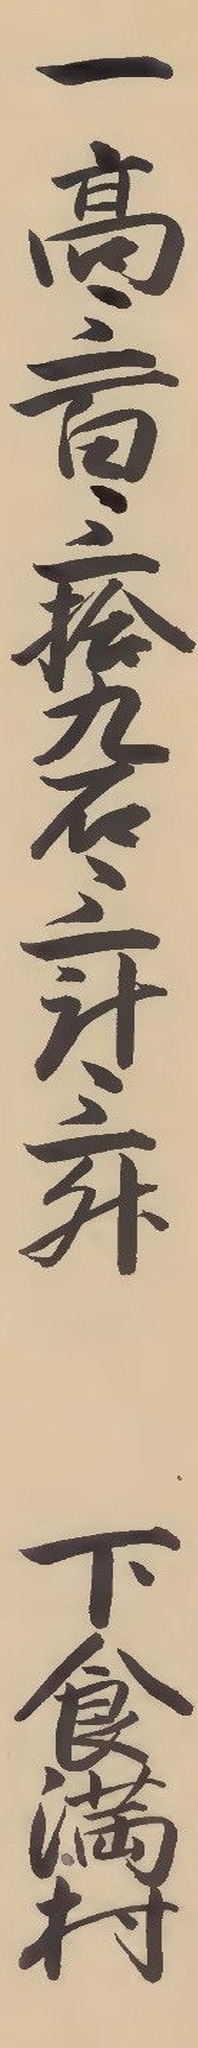一高三百三拾九石三斗三升下食満村
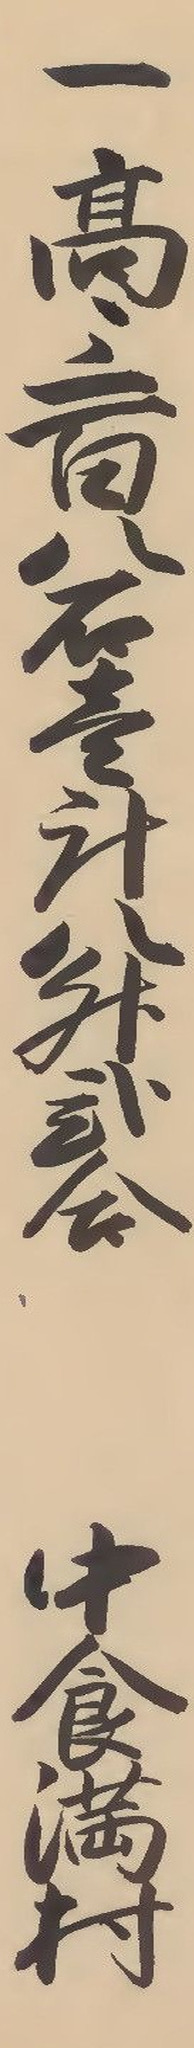一高三百八石壱斗八升弐合中食満村
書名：摂津国郷帳
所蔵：国立公文書館 National Archives of Japan
